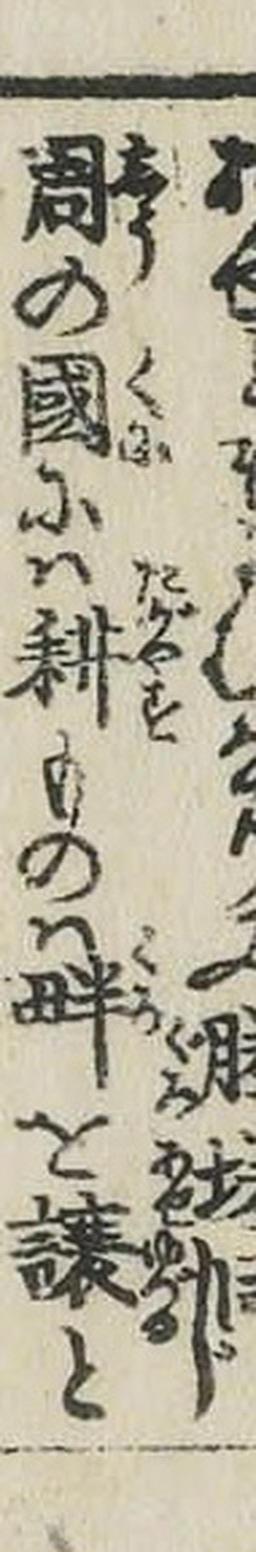周の国には耕ものは畔を譲と
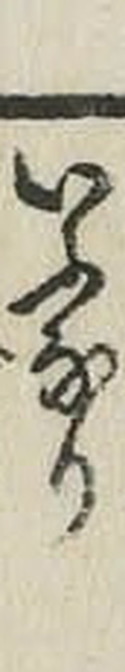いふなり
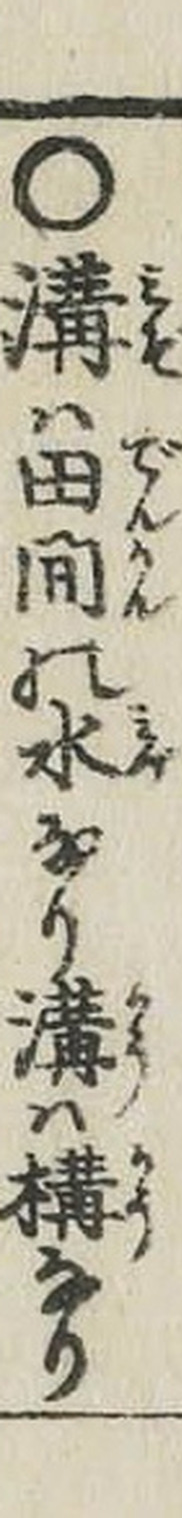○溝は田間の水なり溝は構なり
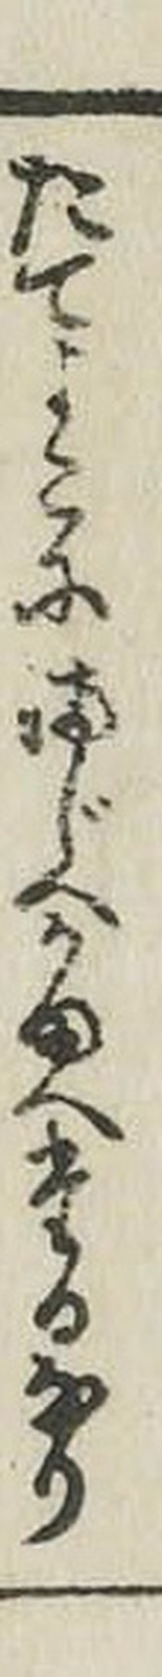たてよこにまじへかまへたるなり
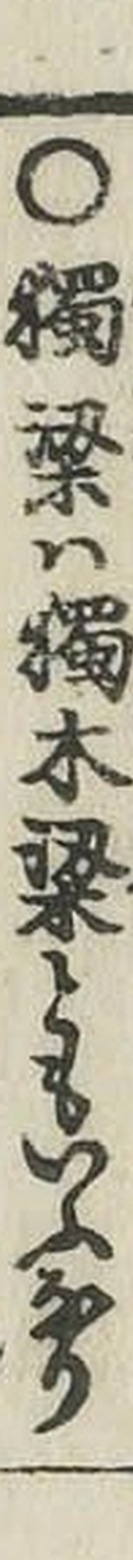○独梁は独木梁ともいふなり
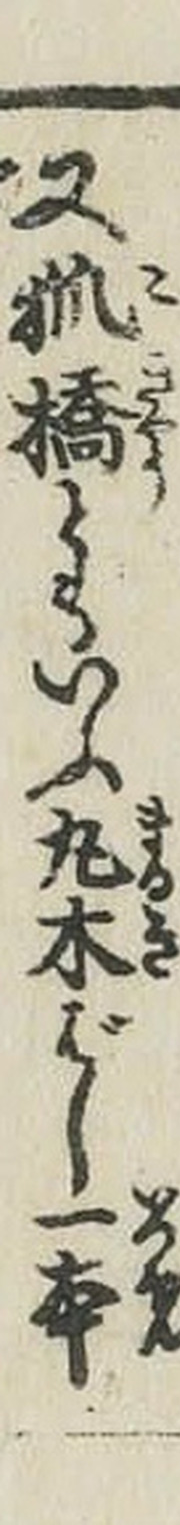又狐橋ともいふ丸木ばし一本
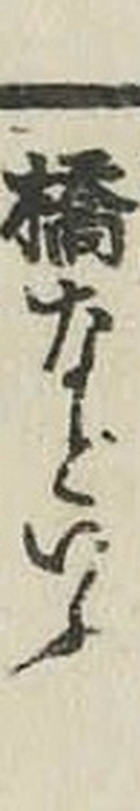橋などいふ
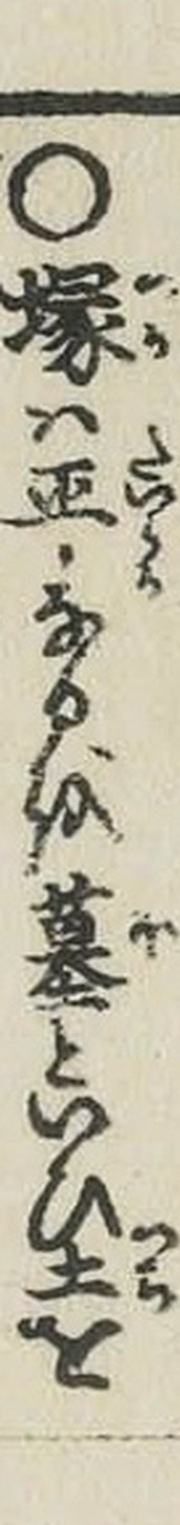○塚は平なるを墓といひ土を
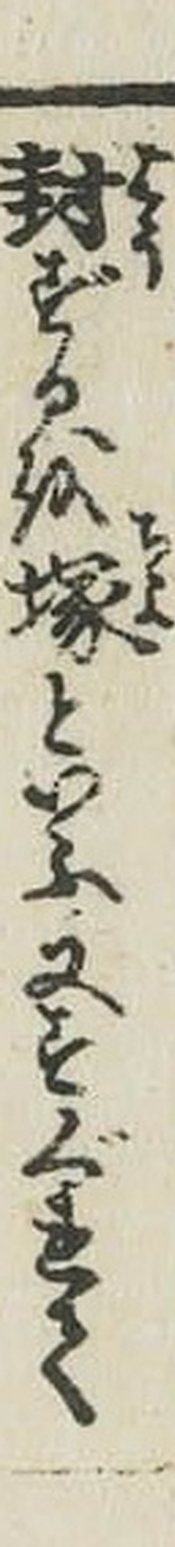封ずるを塚といふ又すぐれて
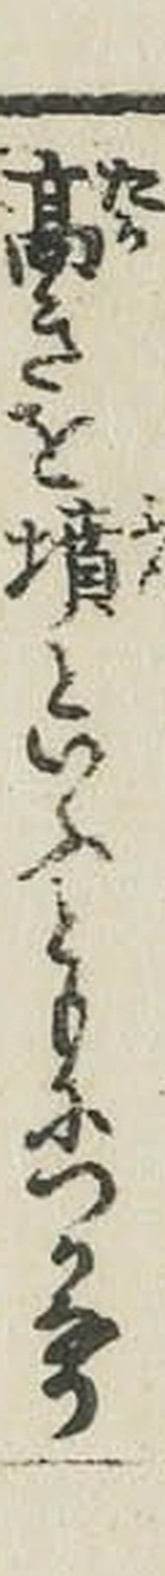高きを墳といふともにつかなり
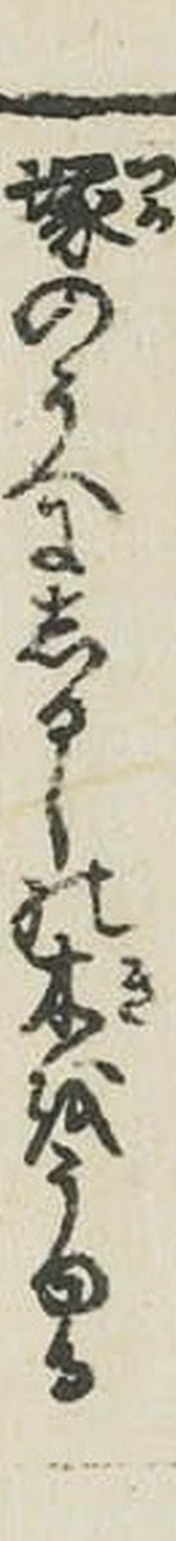塚のうへにしるしの木をうゆる
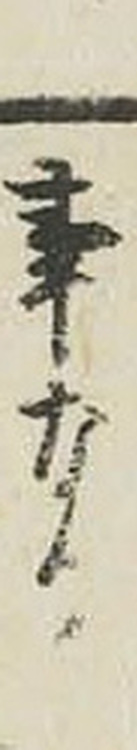事なり
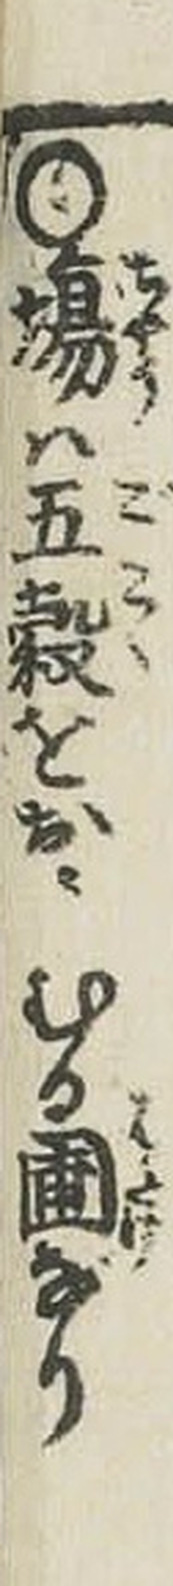○場は五穀をおむる圃なり
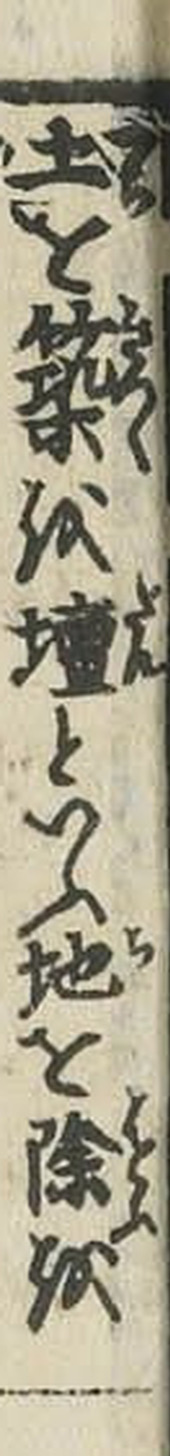土を築を壇といふ地を除を
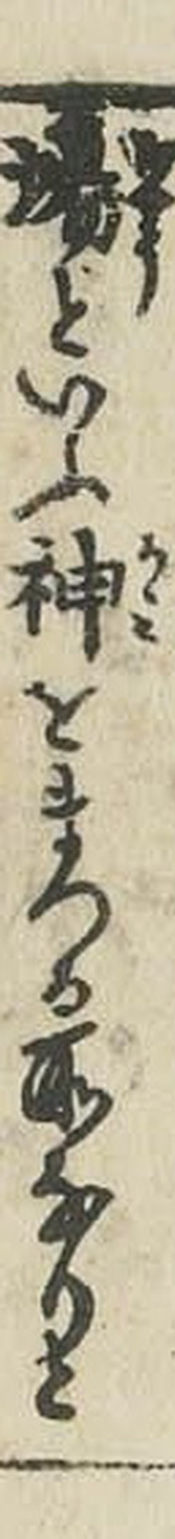場といふ神をまつる所なりと
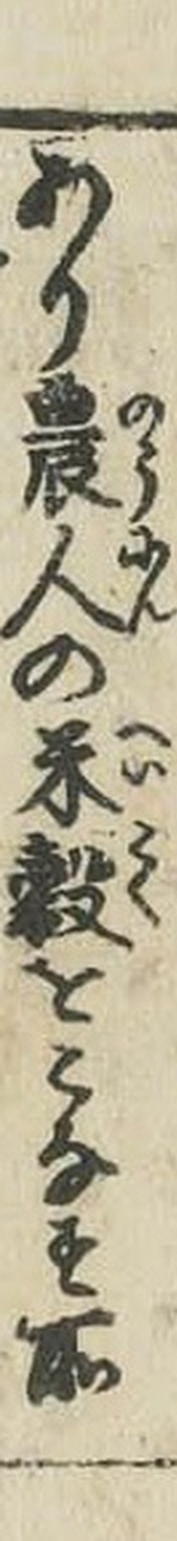あり農人の米穀をこなす所
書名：増補頭書訓蒙図彙大成 10巻 2:巻之1-3
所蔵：東京学芸大学教育コンテンツアーカイブ
